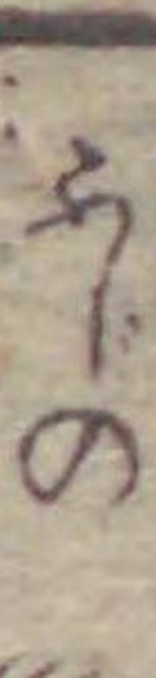ふじの
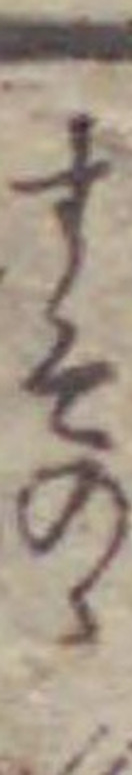すそのゝ
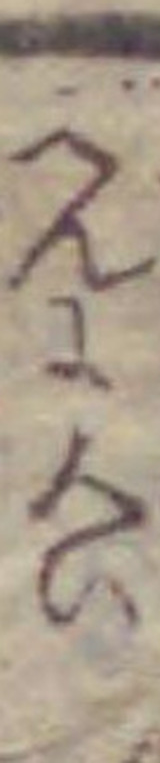へんに大い
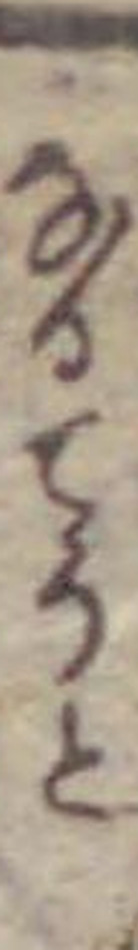なるてうと
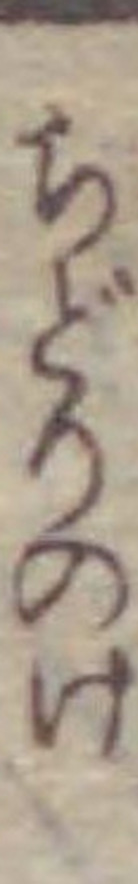ちどりのけ
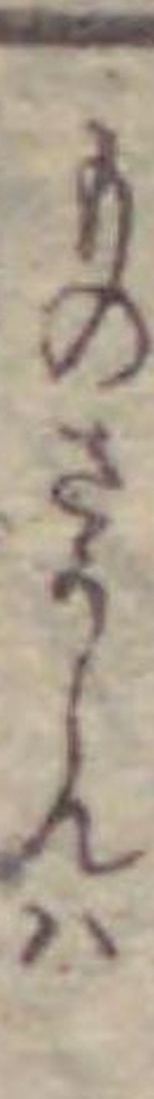ものさうしんは
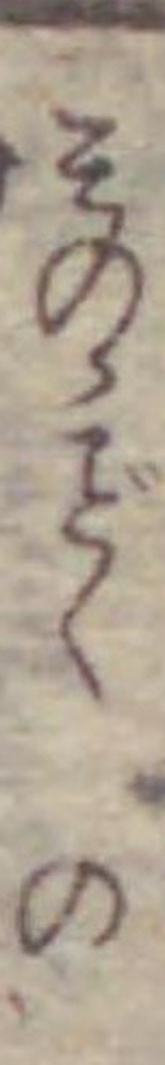みのゝごとくの
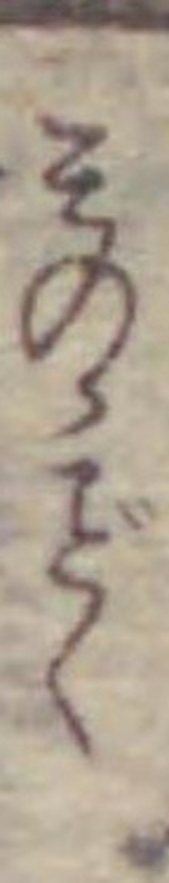みのゝごとくの
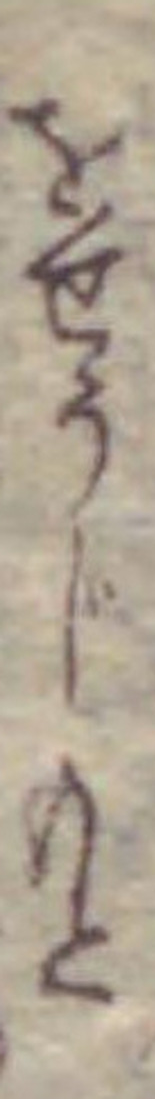をせうじもと
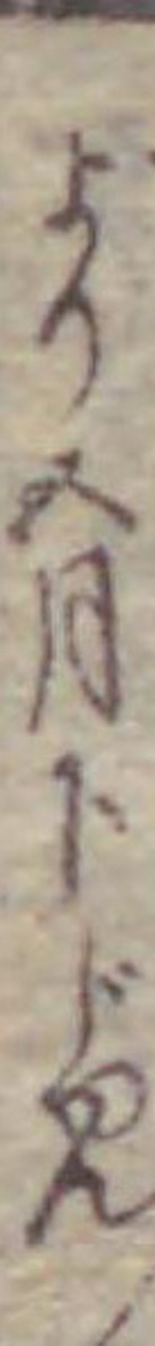より五月下じゆんの
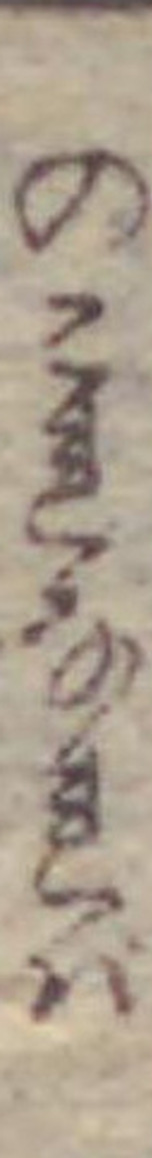これなれば
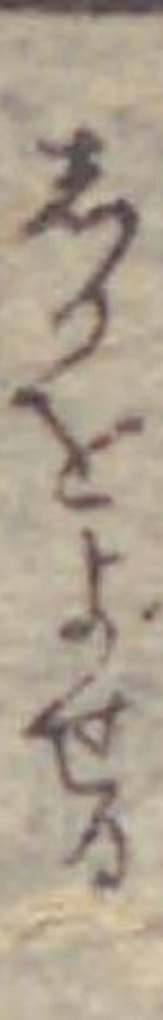しかをよせる
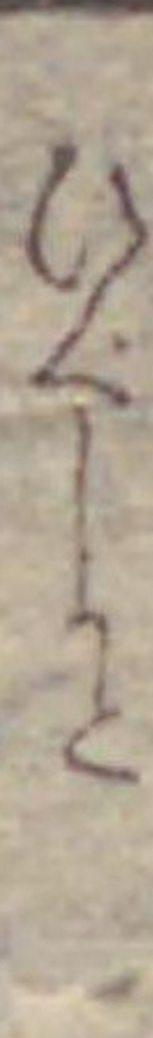ひぐしかと
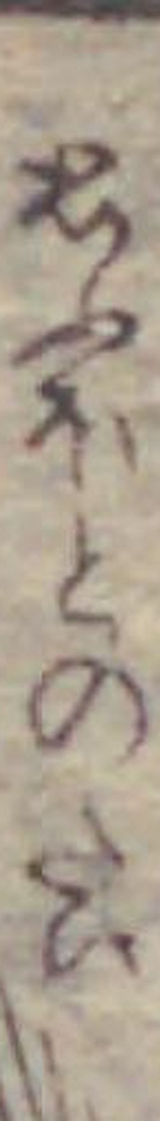思ふほとのたい
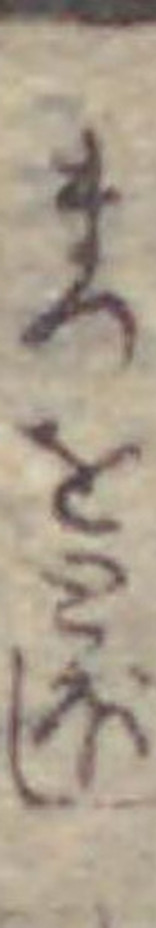まつをとぼし
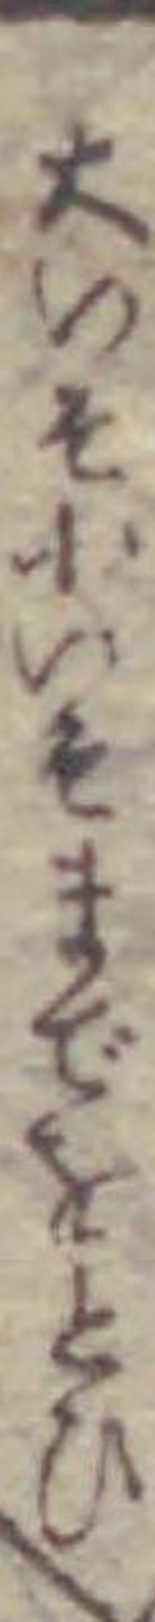大いそ小いそまでをとひ
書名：武家物奇談 : 3巻
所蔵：国立国会図書館 National Diet Library, JAPAN
